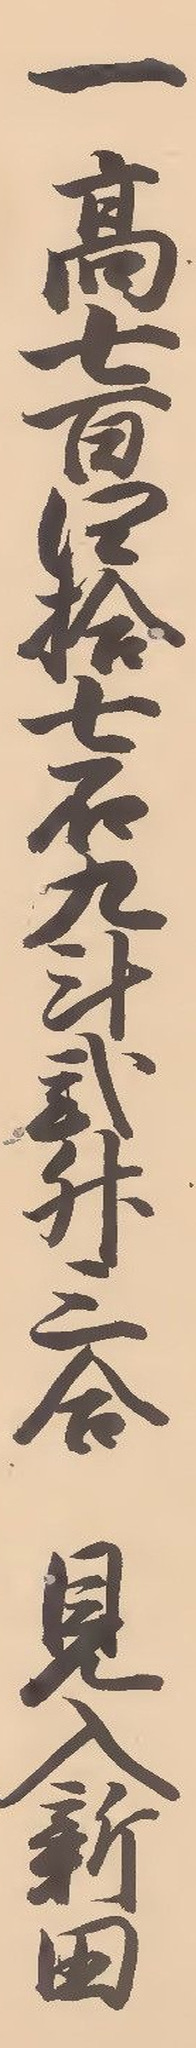一高七百四拾七石九斗弐升三合見入新田

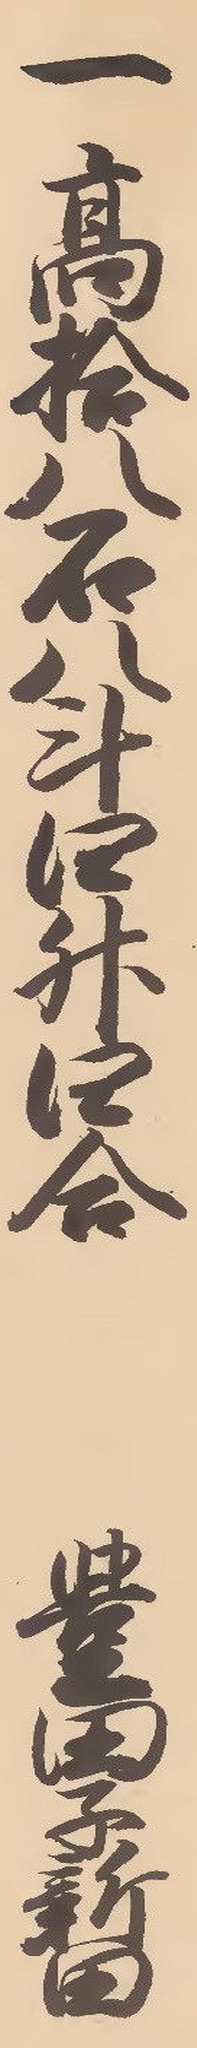一高拾八石八斗四升四合豊田子新田
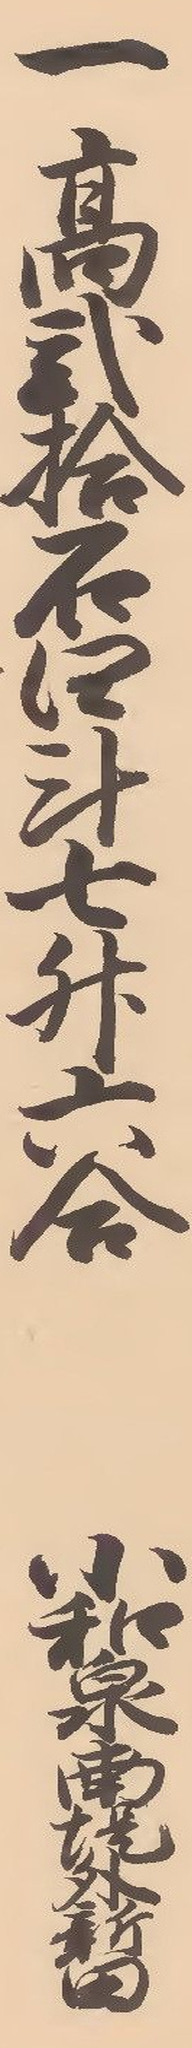一高弐拾石四斗七升六合小和泉南堤外新田
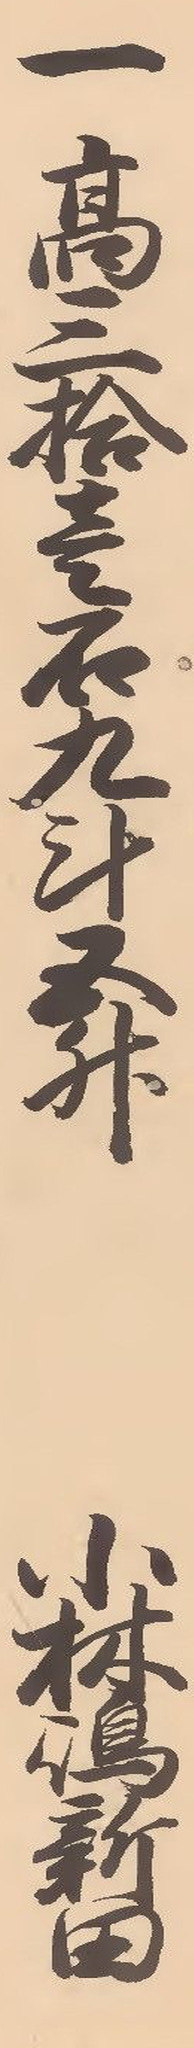一高三拾壱石九斗五升小林嶋新田
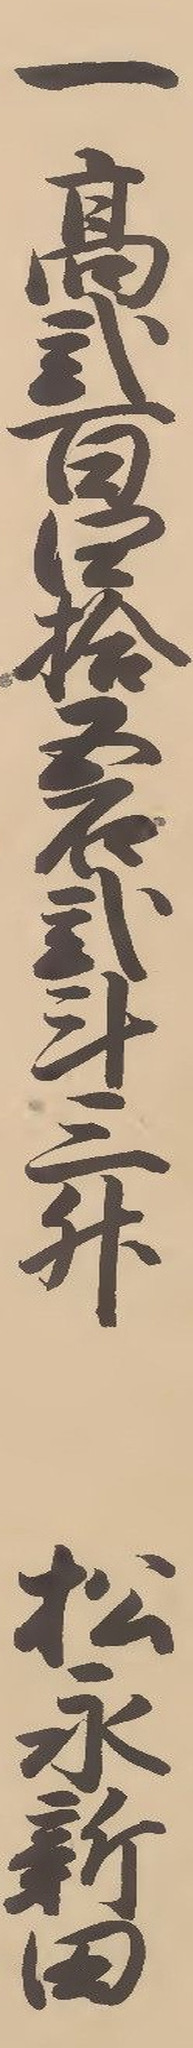一高弐百四拾五石弐斗三升松永新田
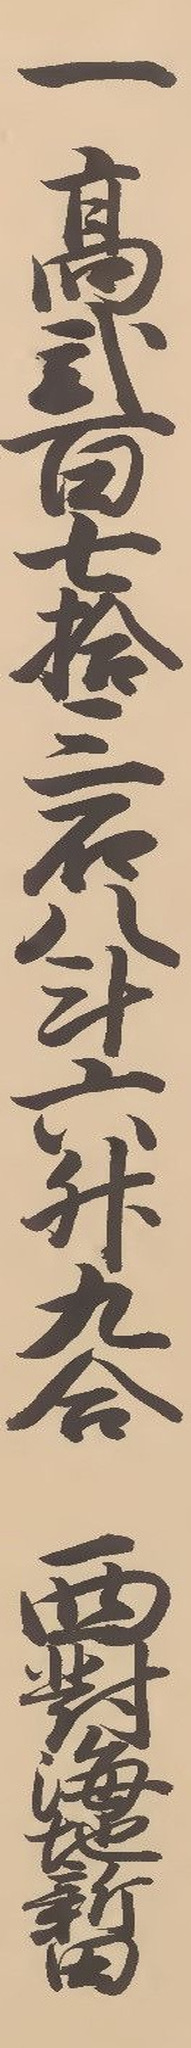一高弐百七拾三石八斗六升九合西対海地新田
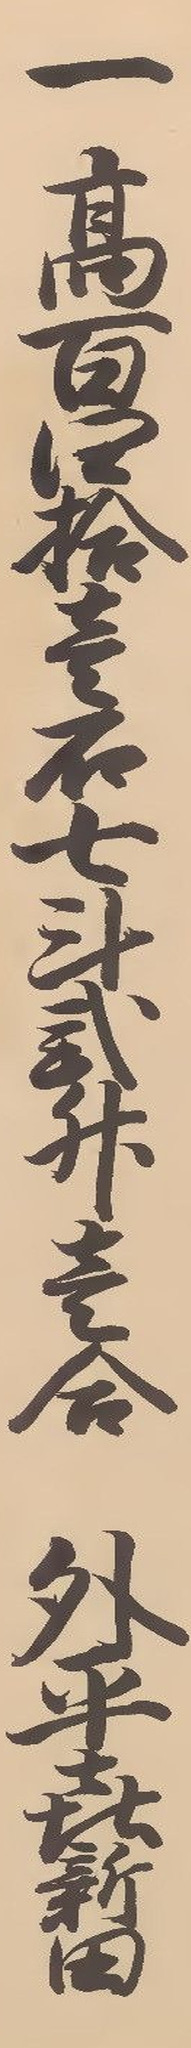一高百四拾壱石七斗弐升壱合外平喜新田
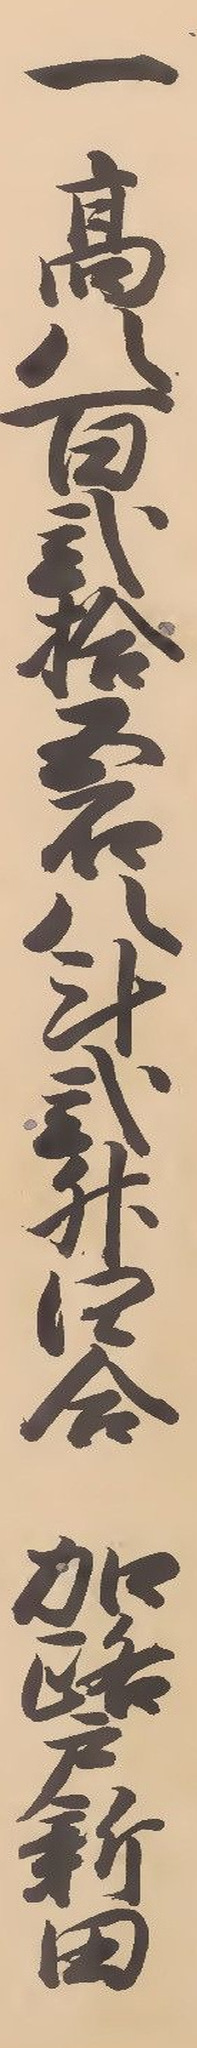一高八百弐拾五石八斗弐升四合加路戸新田

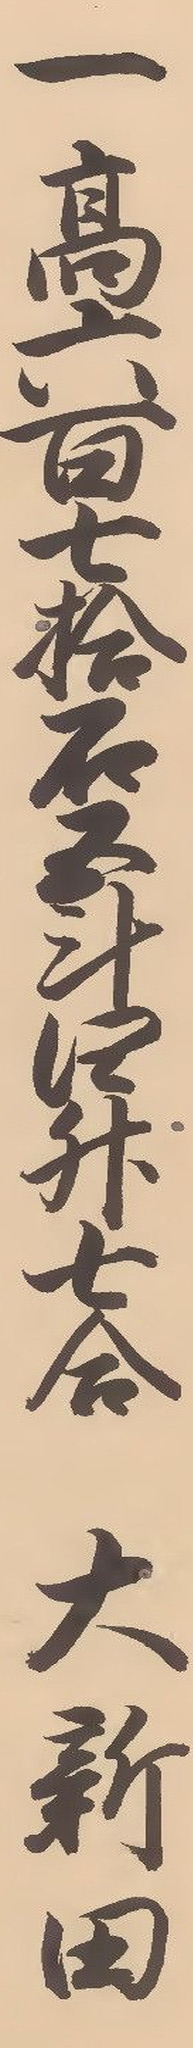一高六百七拾石五斗四升七合大新田
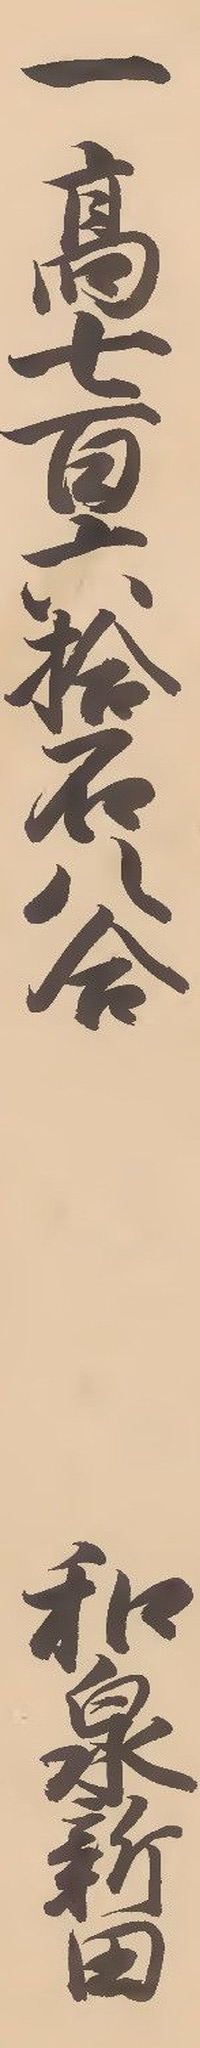一高七百六拾石八合和泉新田
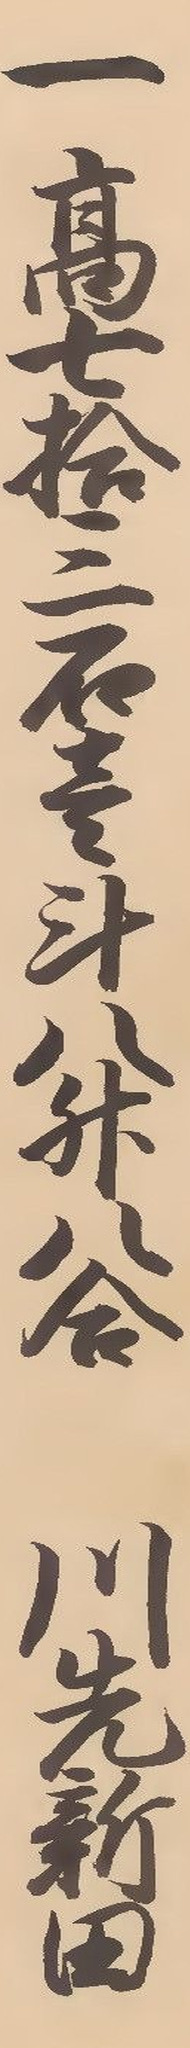一高七拾三石壱斗八升八合川先新田
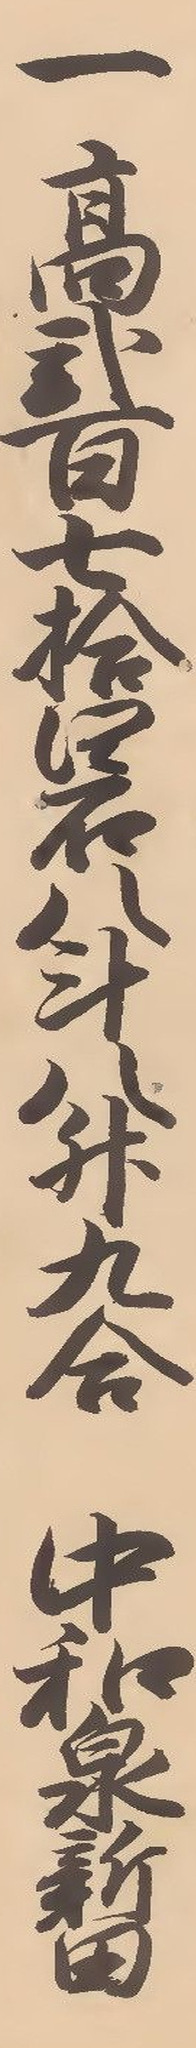一高弐百七拾四石八斗八升九合中和泉新田
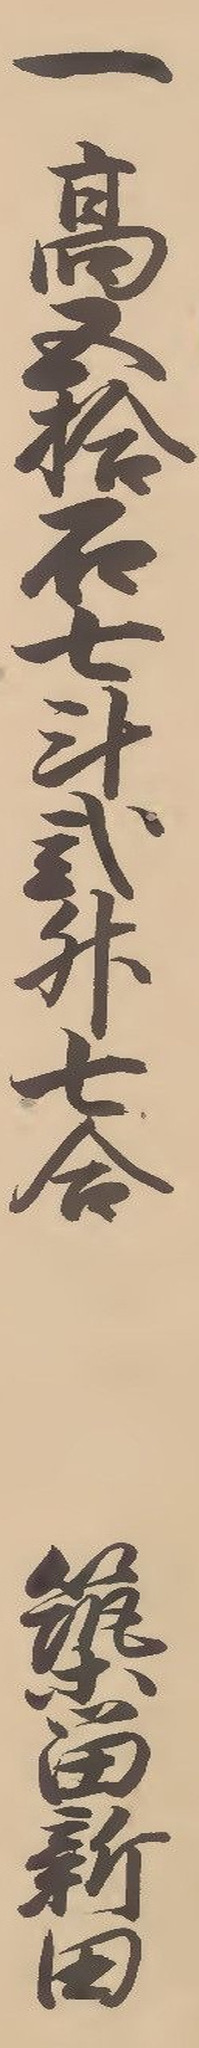一高五拾石七斗弐升七合築留新田
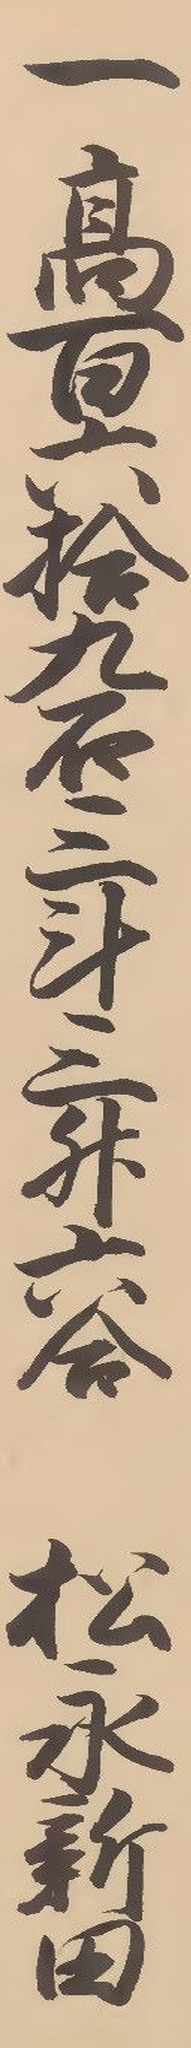一高百六拾九石三斗三升六合松永新田
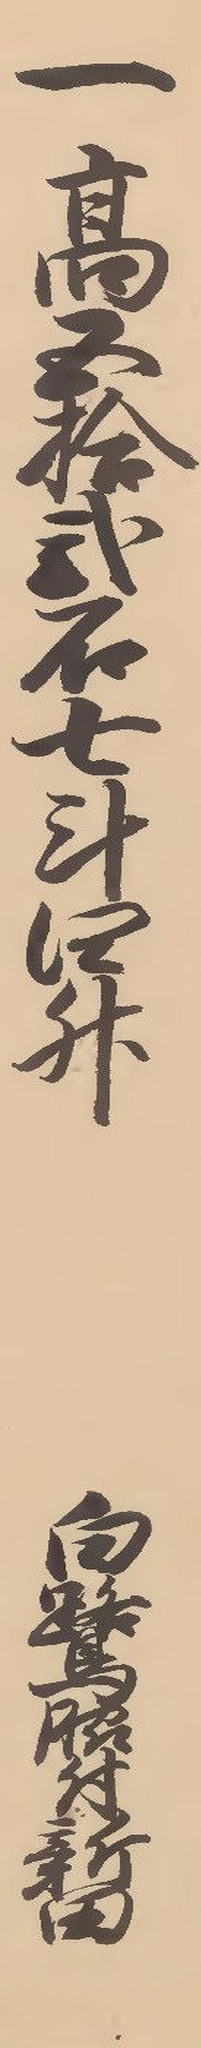一高五拾弐石七斗四升白鷺脇付新田
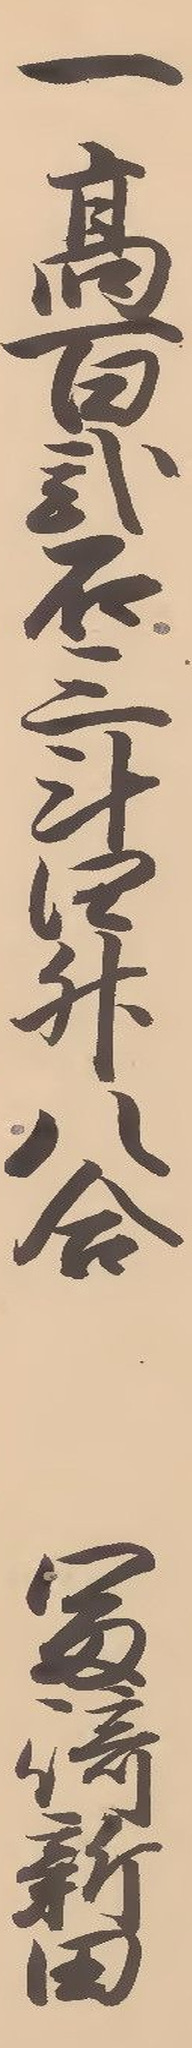一高百弐石三斗四升八合富崎新田
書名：伊勢国郷帳
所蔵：国立公文書館 National Archives of Japan
